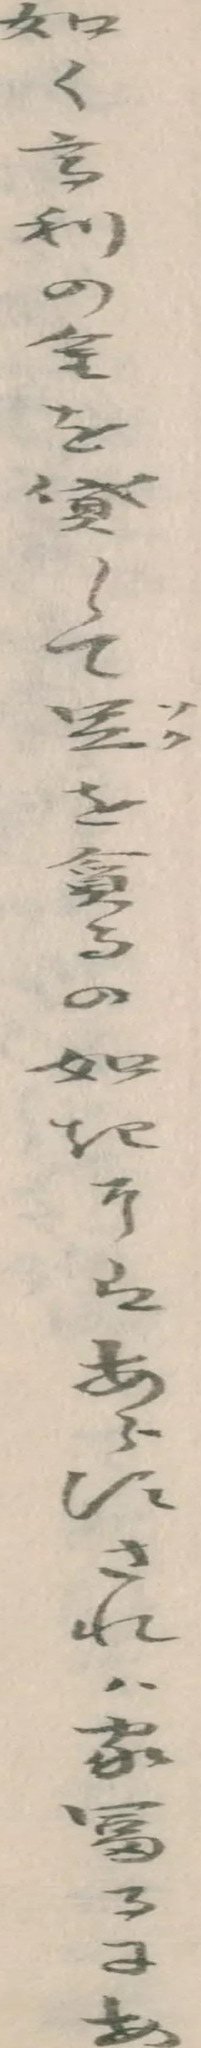如く高利の金を貸して足を貪るの如きにはあらすされは家冨るにあ

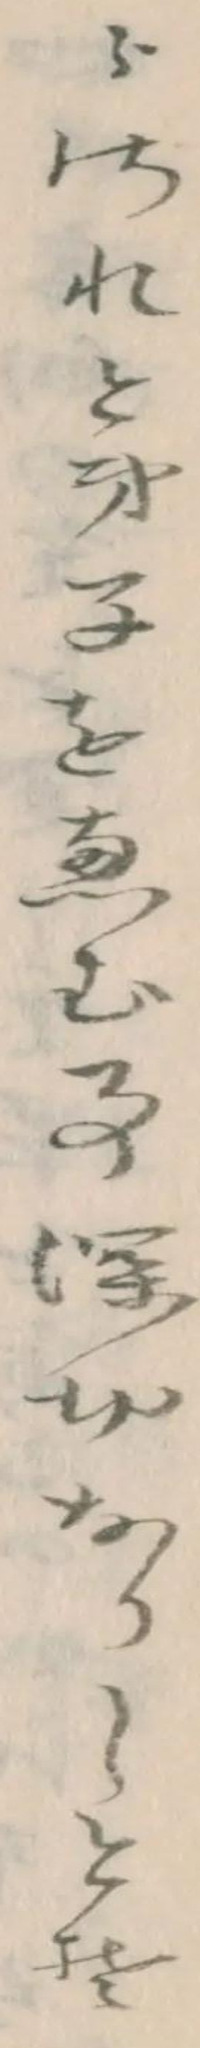らされと弟子を恵む事深切なりしとそ
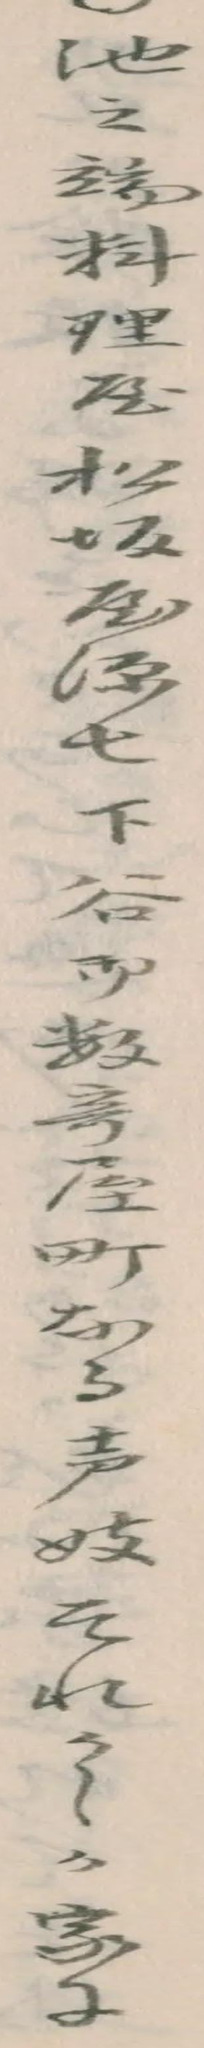〇池之端料理屋松坂屋源七下谷御数寄屋町なる声妓それかしか家に
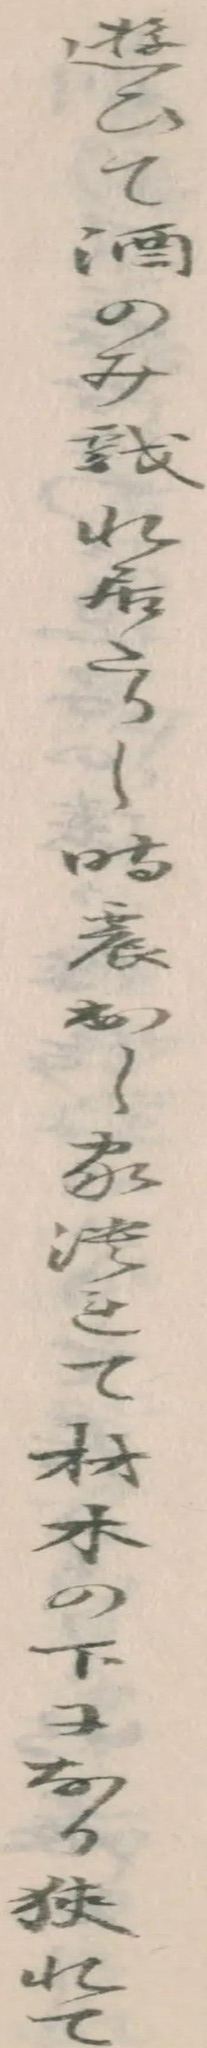遊ひて酒のみ戯れ居たりし時震出し家潰れて材木の下になり挟れて
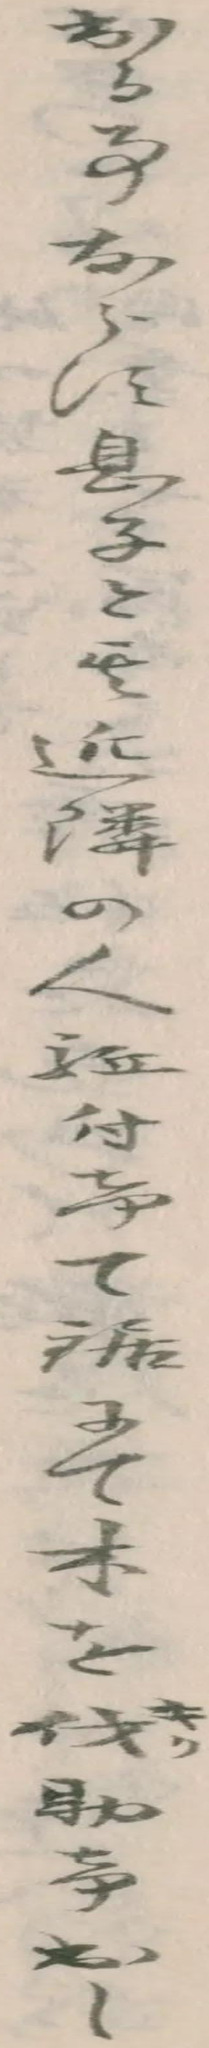出る事ならす息子と其近隣の人駈付けて鋸にて木を伐助け出し
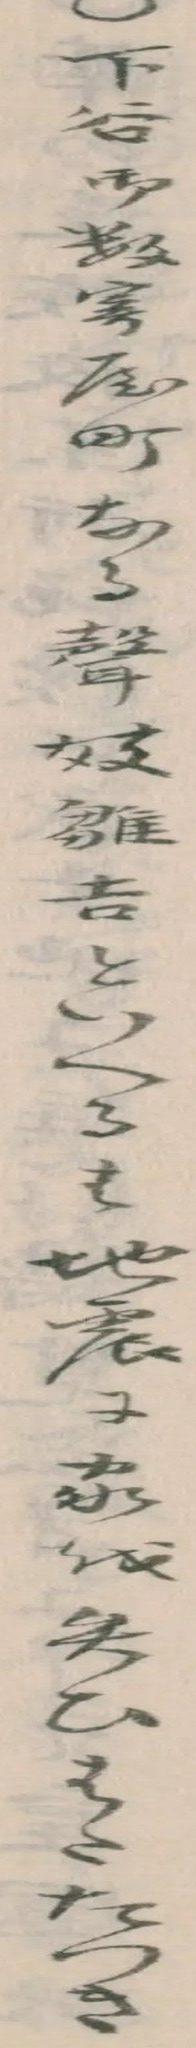〇下谷御数寄屋町なる声妓雛吉といへるは地震に家を失ひはたたつき
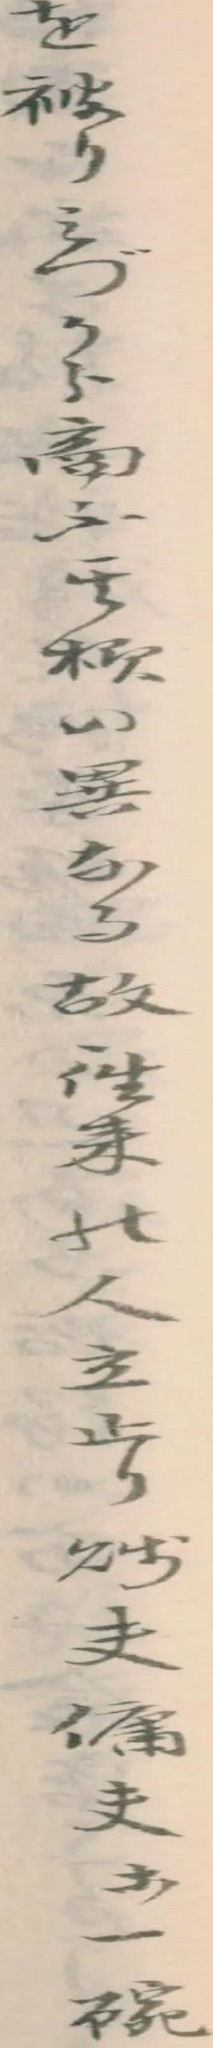を被りみづから商ふ其様の異なる故往来の人立止り賎夫傭夫等一碗
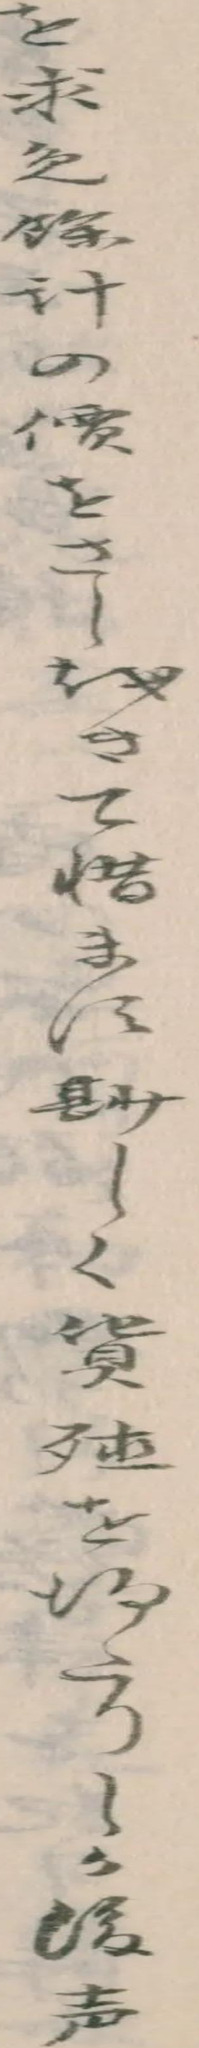を求め余計の価をさしをきて惜ます尠しく貨殖を得たりしか後声
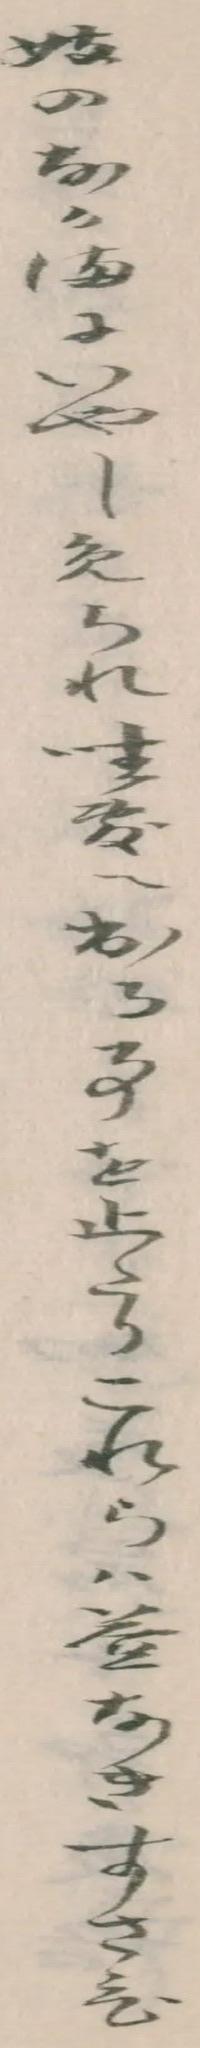妓のなかまにいやしめられ坐敷へ出る事を止たりこれらは益なきすさひ
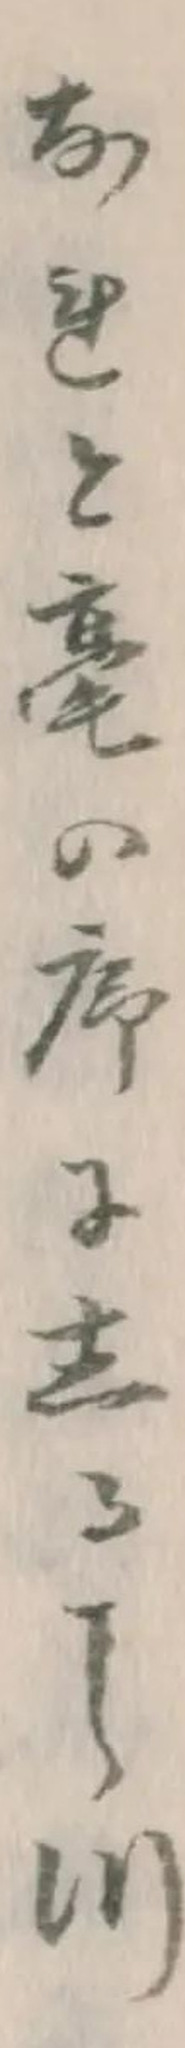なれと毫の序にしるしつ
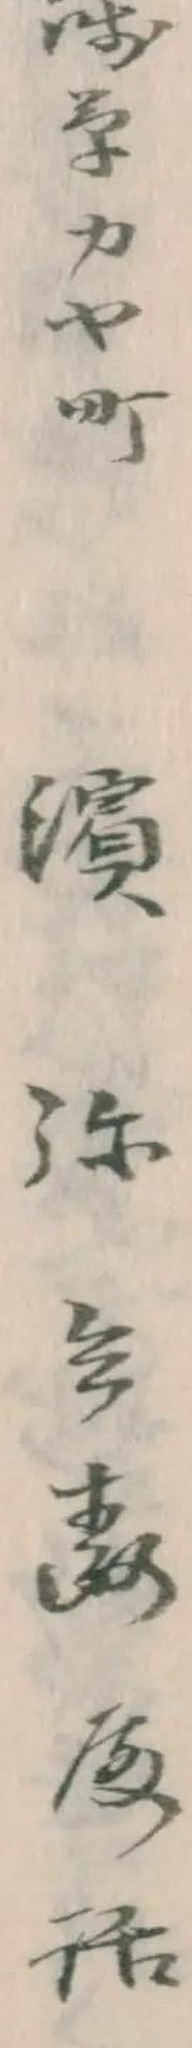浅草カヤ町濱弥兵衛殿話
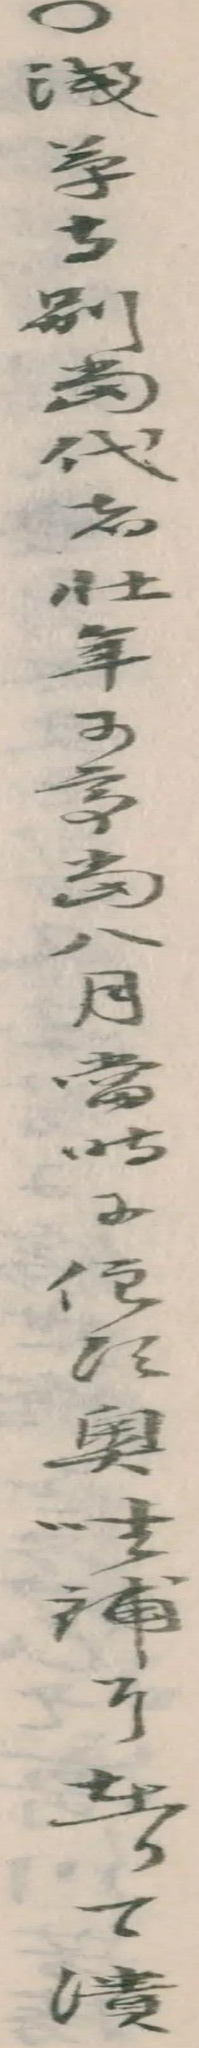〇浅草寺別当代は壮年にて当八月当時に住す奥坐鋪に在りて潰
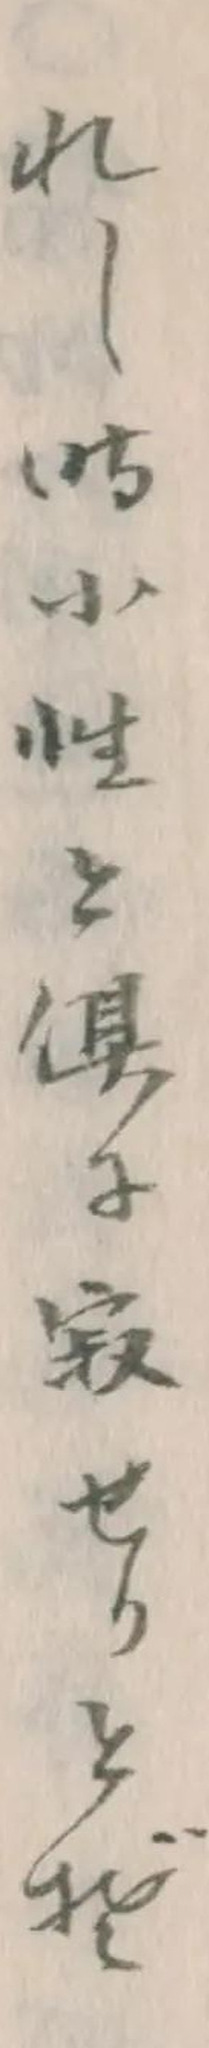れし時小性と倶に寂せりとぞ
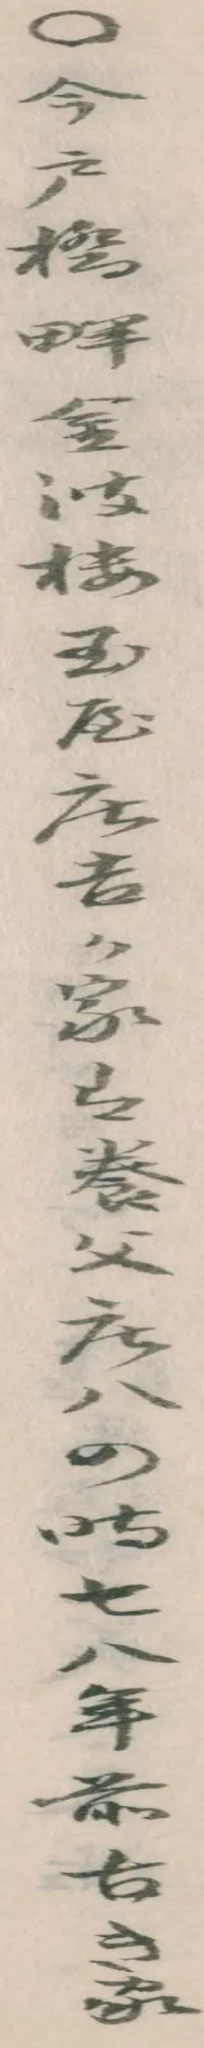〇今戸橋畔金波楼玉屋庄吉か家は養父庄八の時七八年前古き家
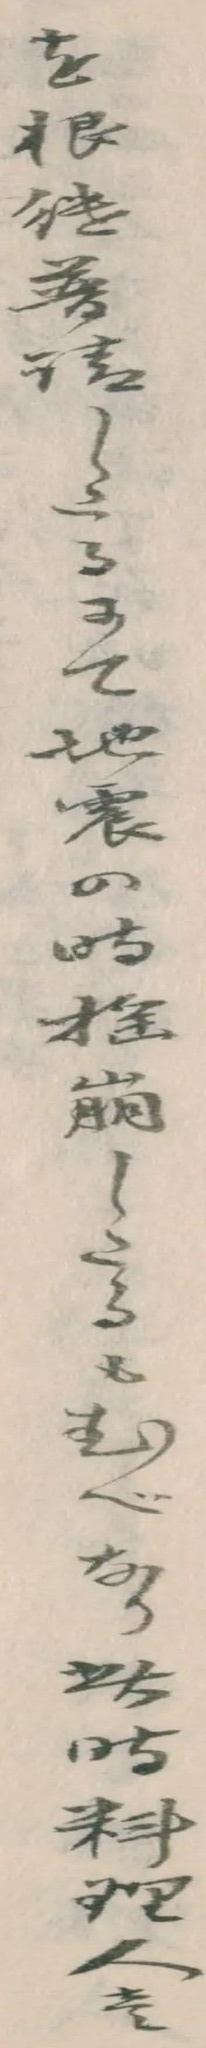を根継普請したるにて地震の時揺崩したるもむべなり此時料理人壹

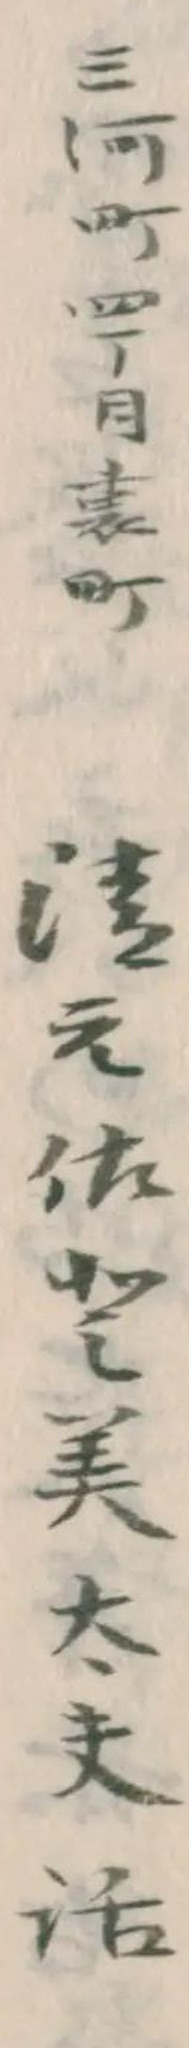三河町四丁目裏町清元佐登美太夫話
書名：地災撮要. 巻7-9(地震之部)
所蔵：国立国会図書館 National Diet Library, JAPAN
